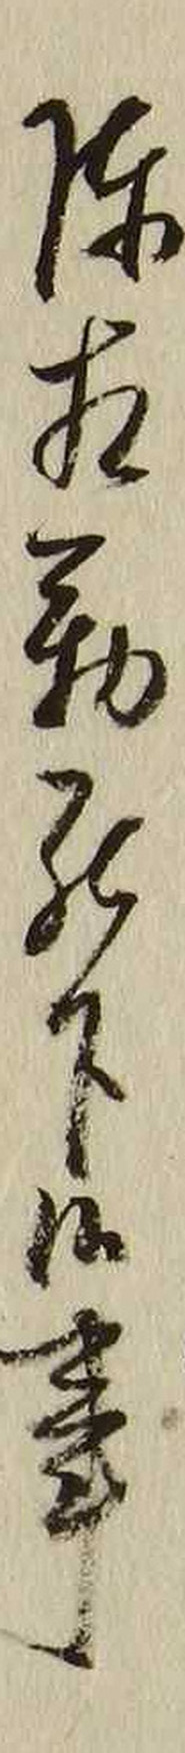陣相勤罷下候事
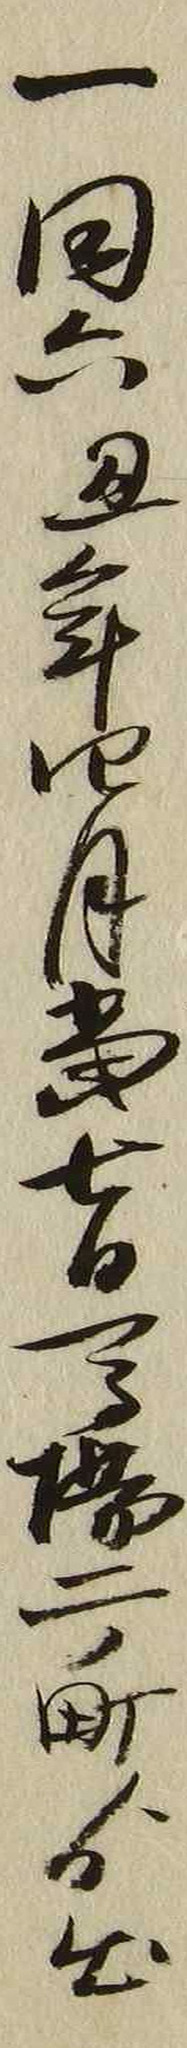一同六丑年四月当七日馬陽二ノ町ゟ出
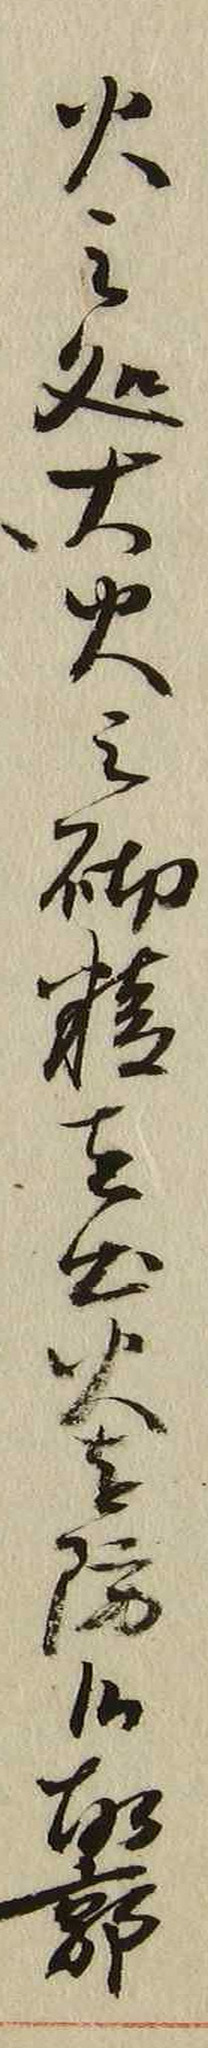火之処大火之砌精を出火を防候故廓
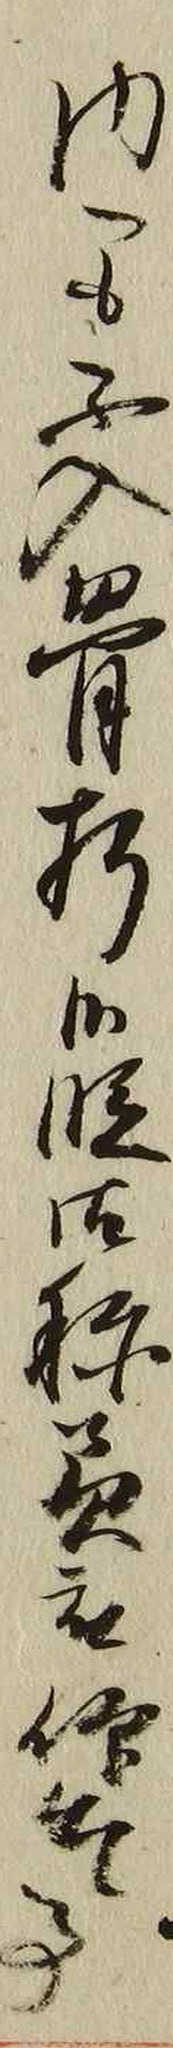内へも不入骨折候段御称美被仰出候事
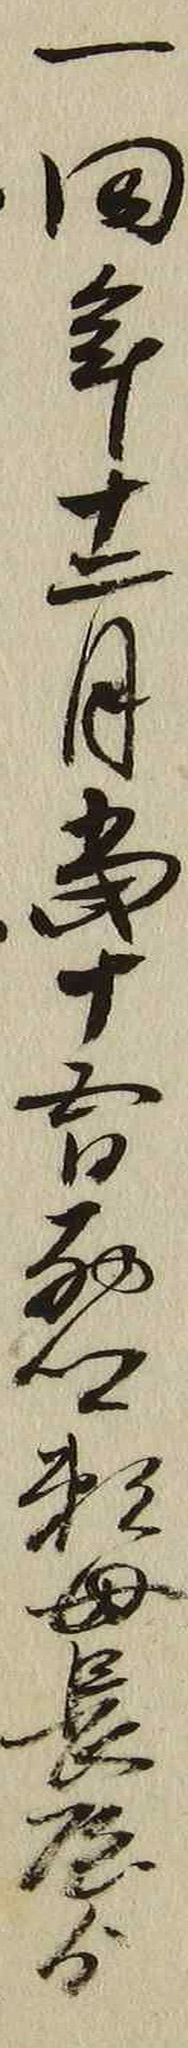一同年十二月当十五日西卿頼母長屋ゟ
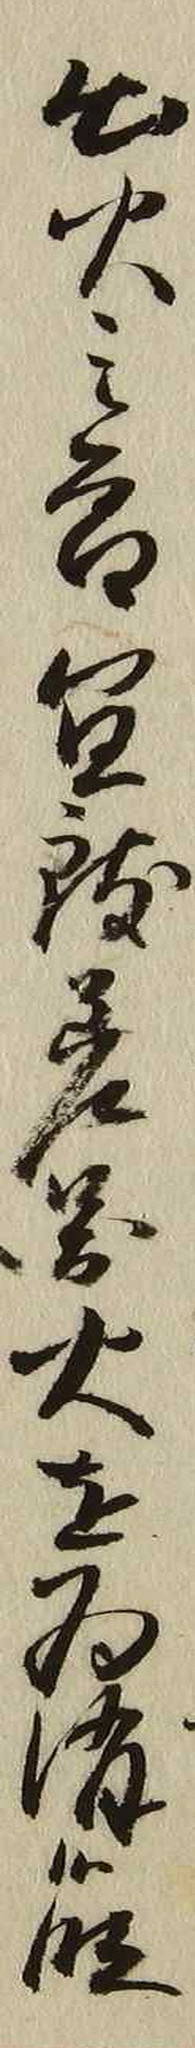出火之節宜致差図火を為消候段
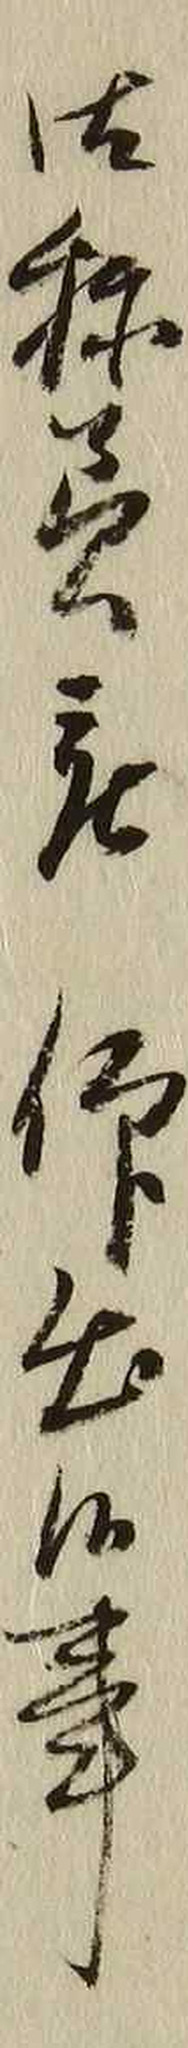御称美被仰出候事
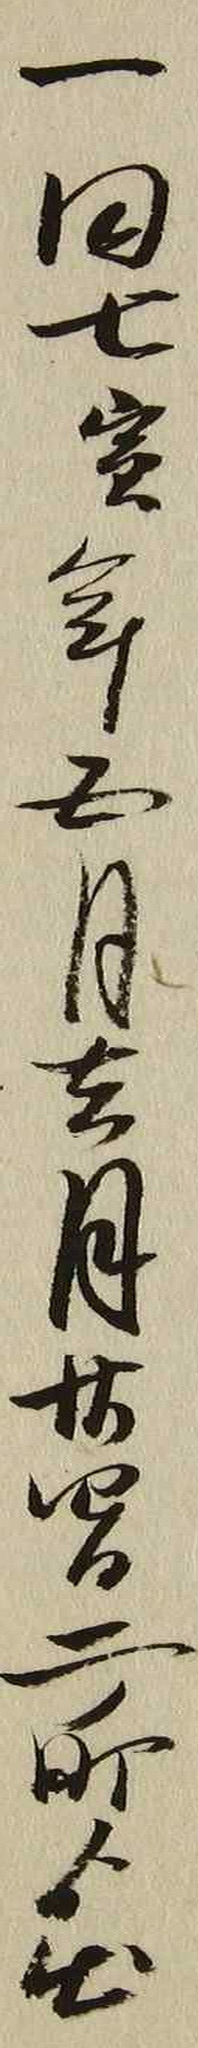一同七寅年五月去月廿四日二ノ町ゟ出
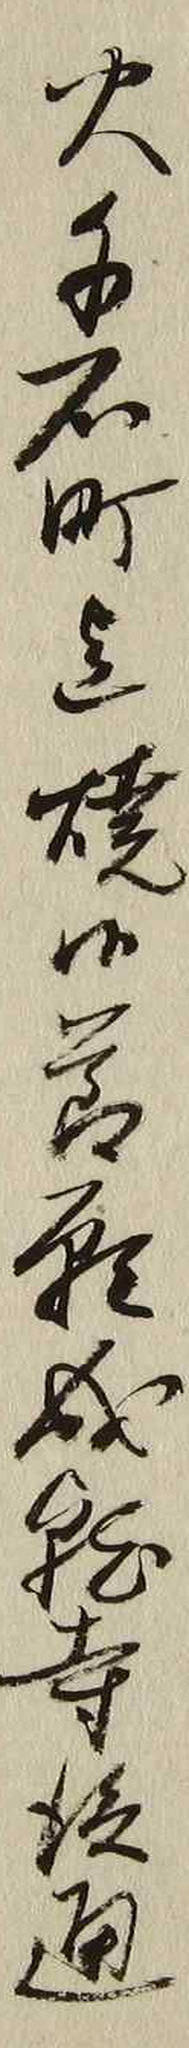火千石町迄焼候節願成就寺後通
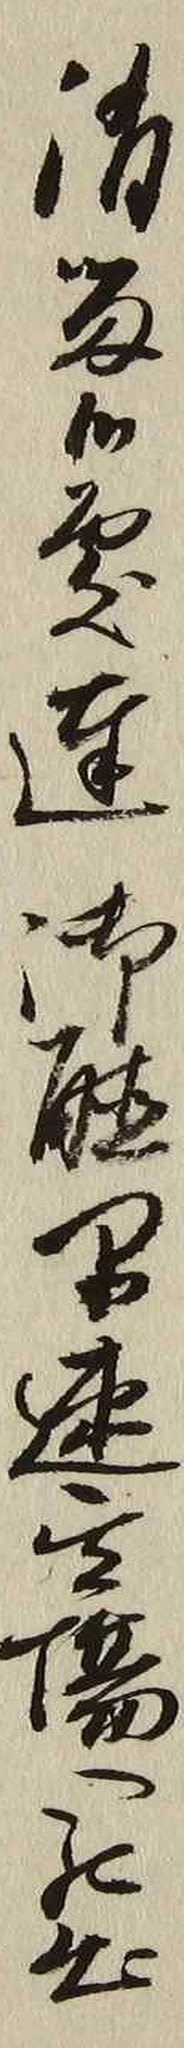消留候処達御聴早速其場へ罷出
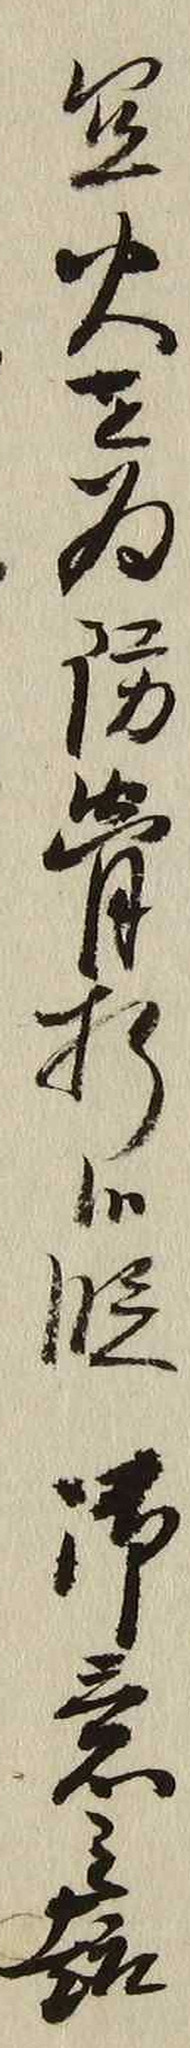宜火を為防骨折候段御意之趣
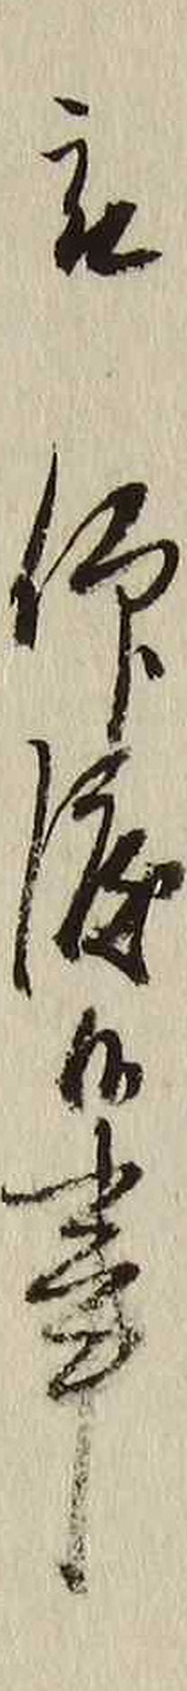被仰渡候事
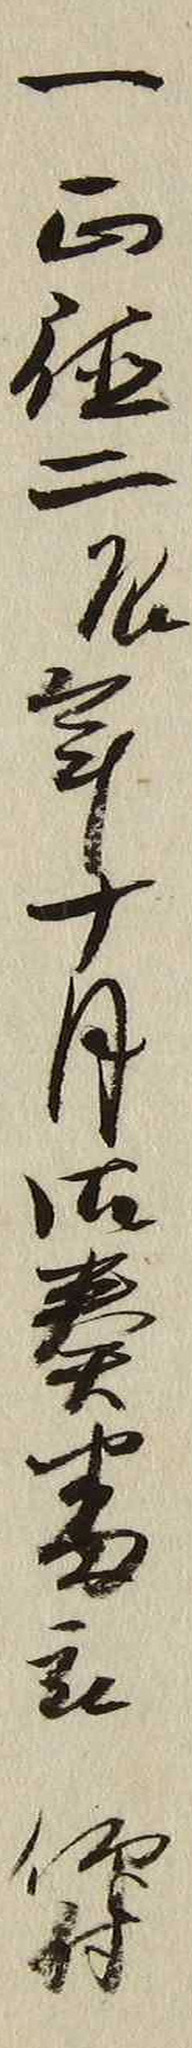一正徳二辰年十月御奏番被仰付
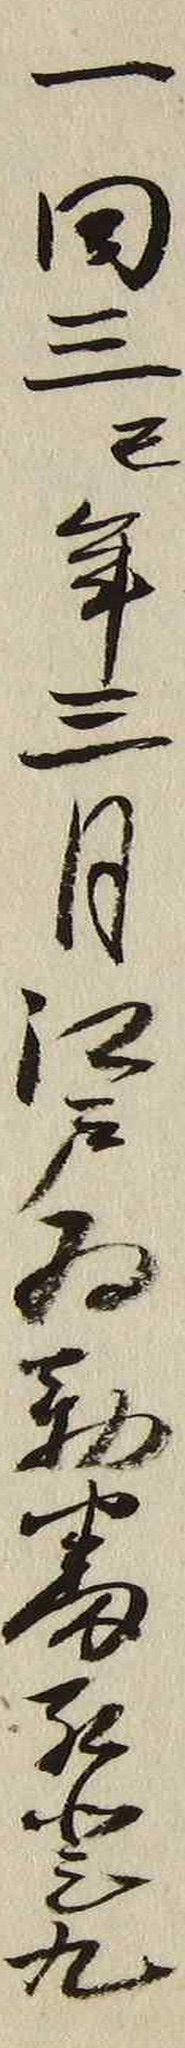一同三巳年三月江戸為勤番罷登九
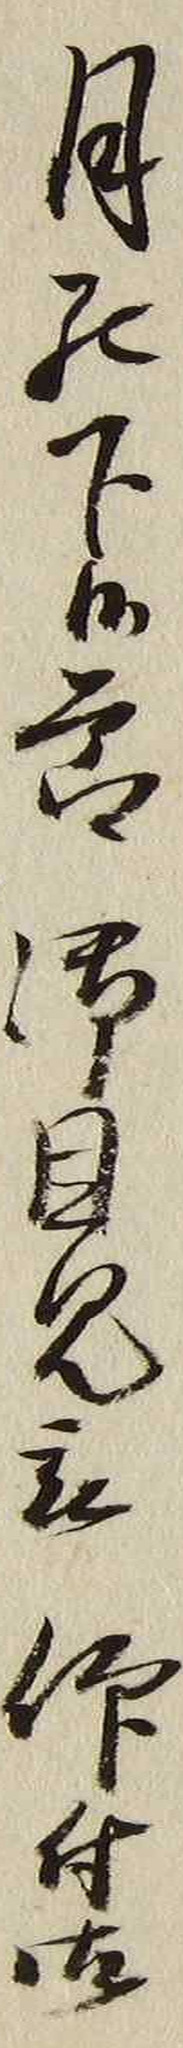月罷下候節御目見被仰付御
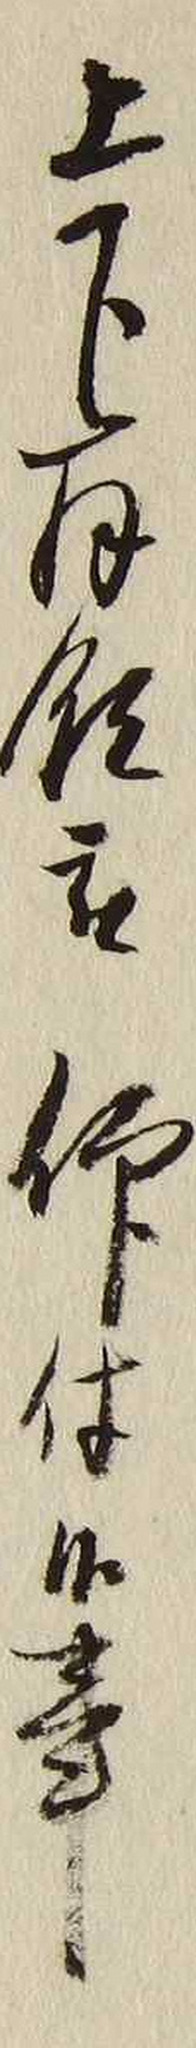上分拝領被仰付候事
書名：諸士系譜　巻之356　す之部6
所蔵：会津若松市立会津図書館
